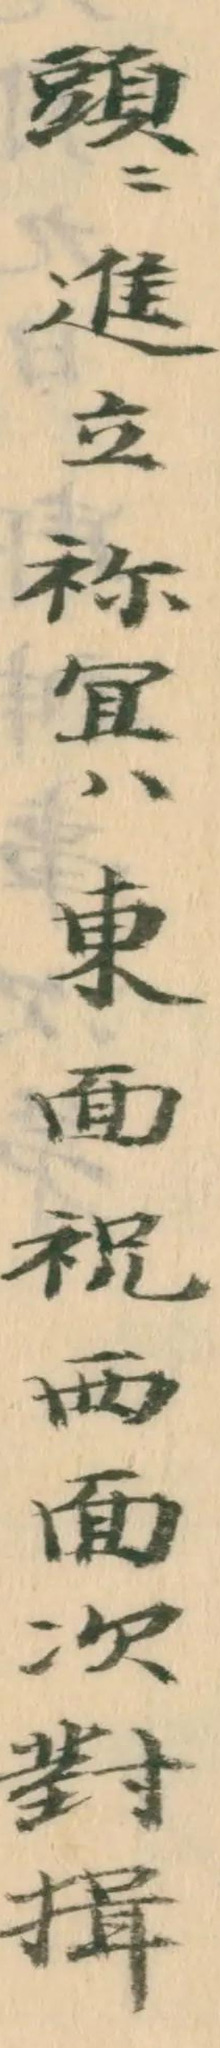頭ニ進立禰宜ハ東面祝西面次対揖

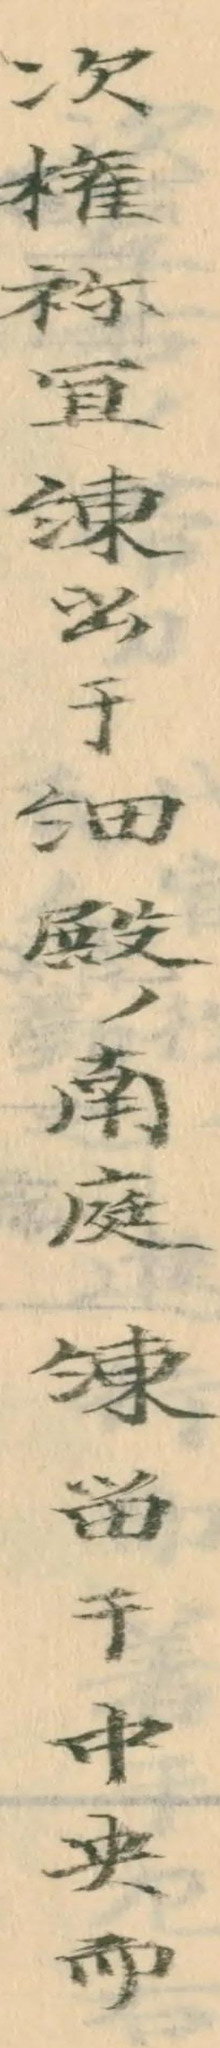次権禰宜練出于細殿ノ南庭練留于中央而
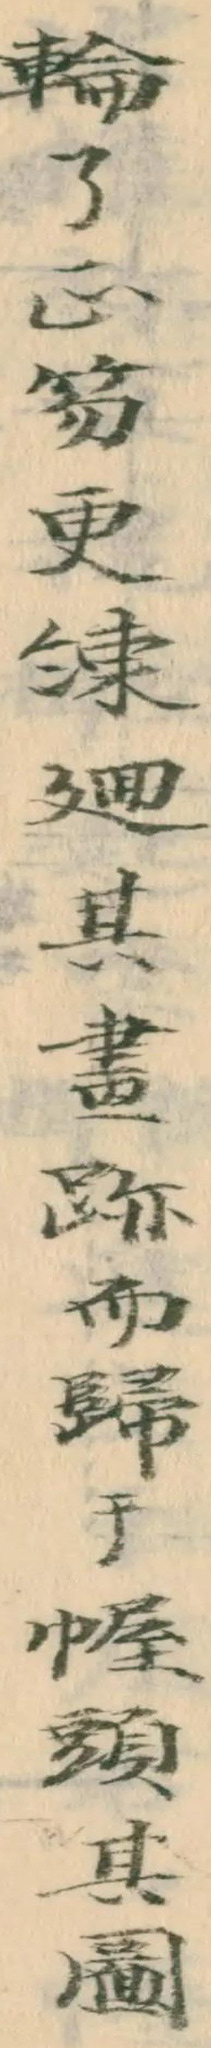輪了正笏更練廻其画跡而帰于幄頭其図
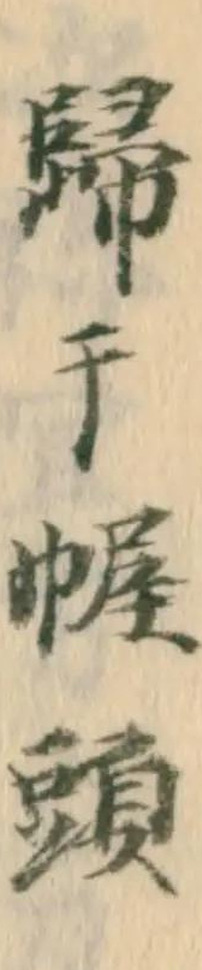帰于幄頭

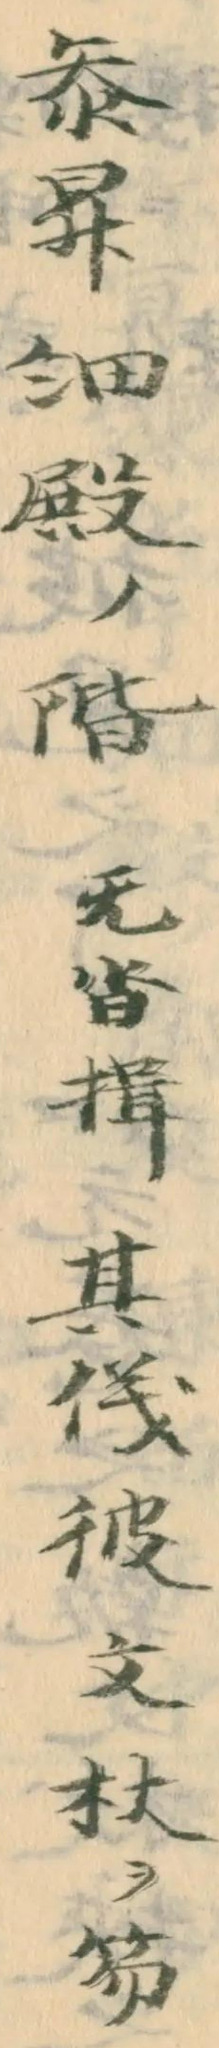参昇細殿ノ階無沓揖其儀彼文杖ヲ笏
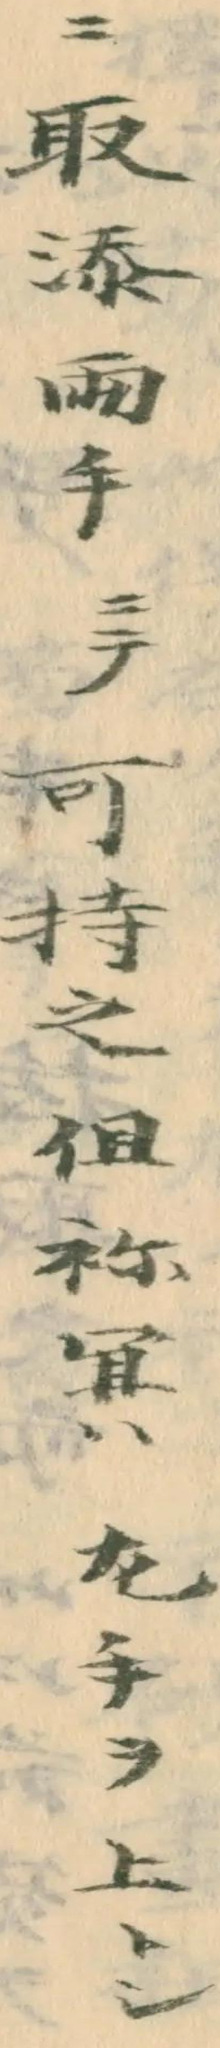ニ取添両手ニテ可持之但禰宜ハ左手ヲ上トシ
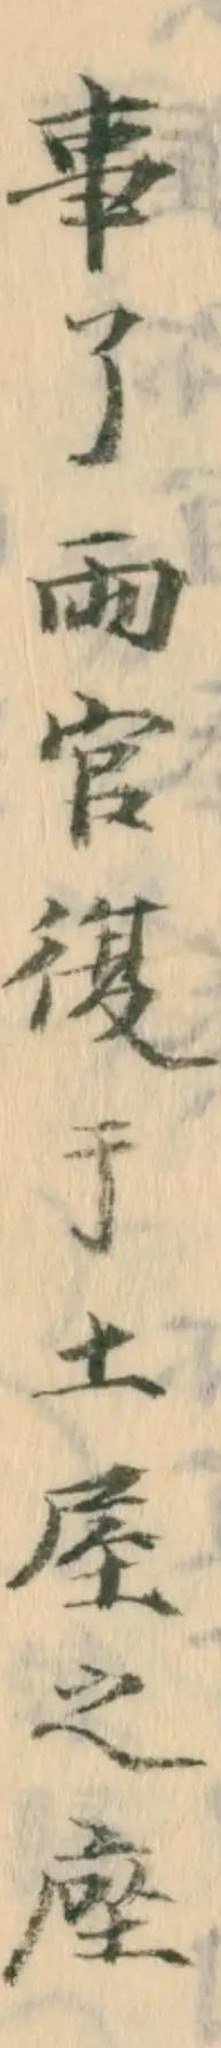事了両官復于土屋之座
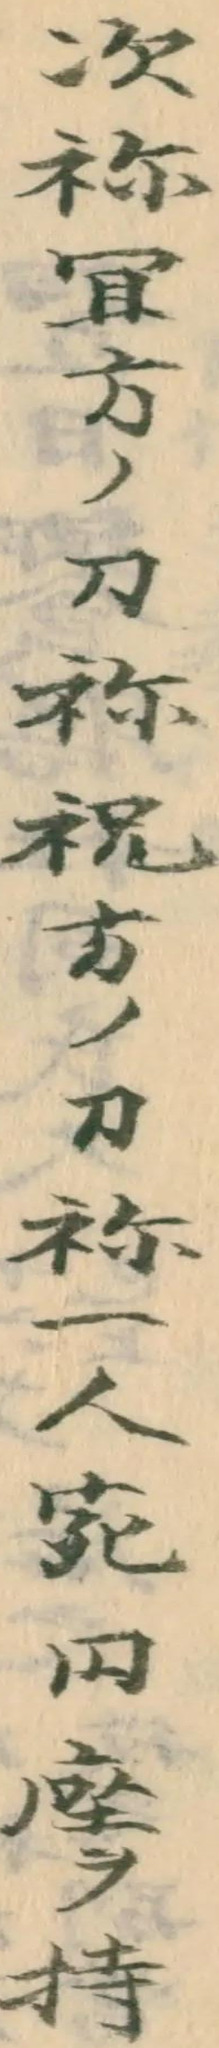次禰宜方ノ刀禰祝方ノ刀禰一人宛円座ヲ持
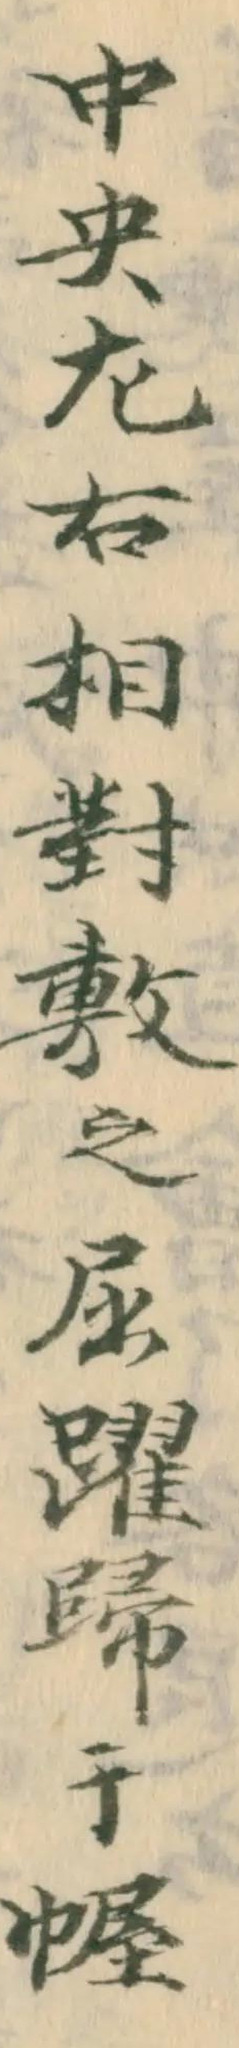中央左右相対敷之屈躍帰于幄
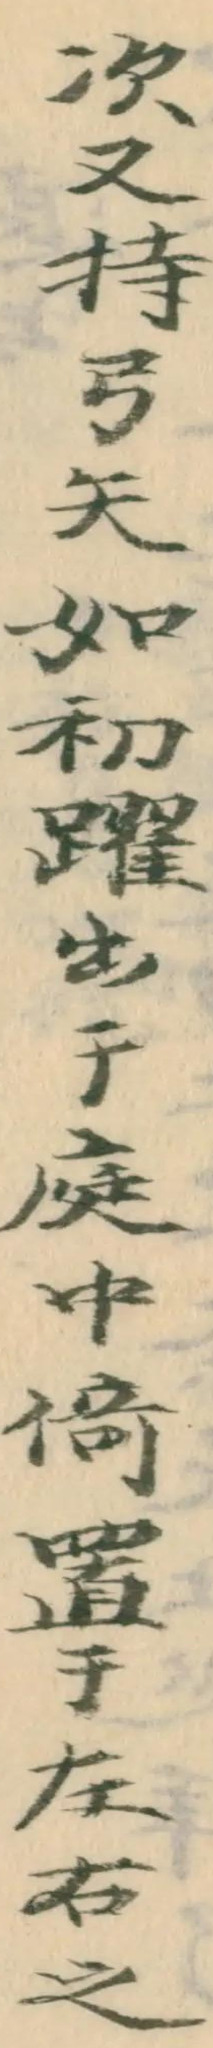次又持弓矢如初躍出于庭中倚置于左右之
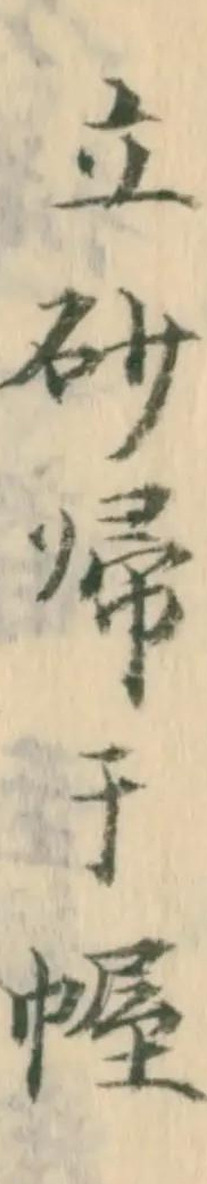立砂帰于幄
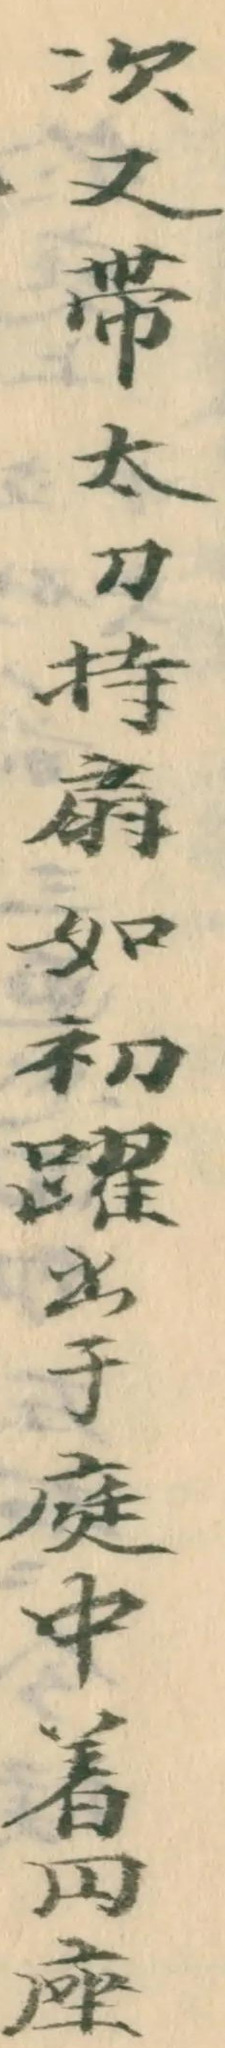次又帯太刀持扇如初躍出于庭中着円座

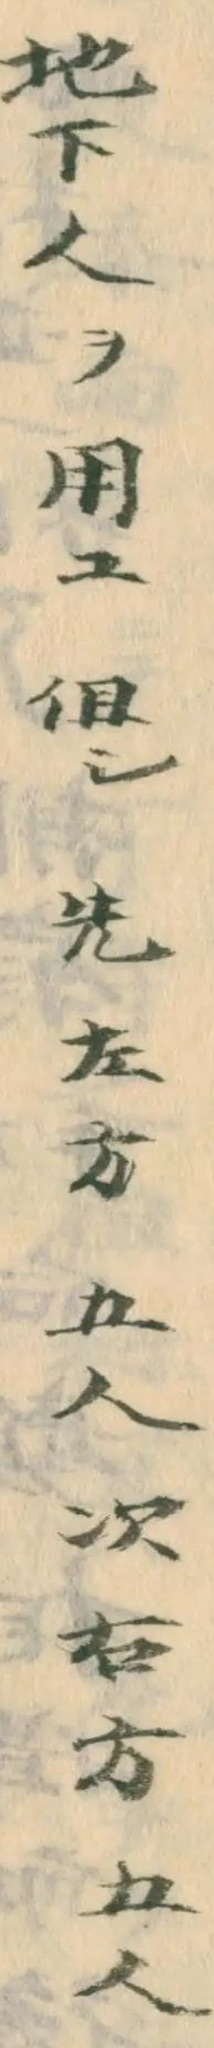地下人ヲ用ユ但シ先左方五人次右方五人
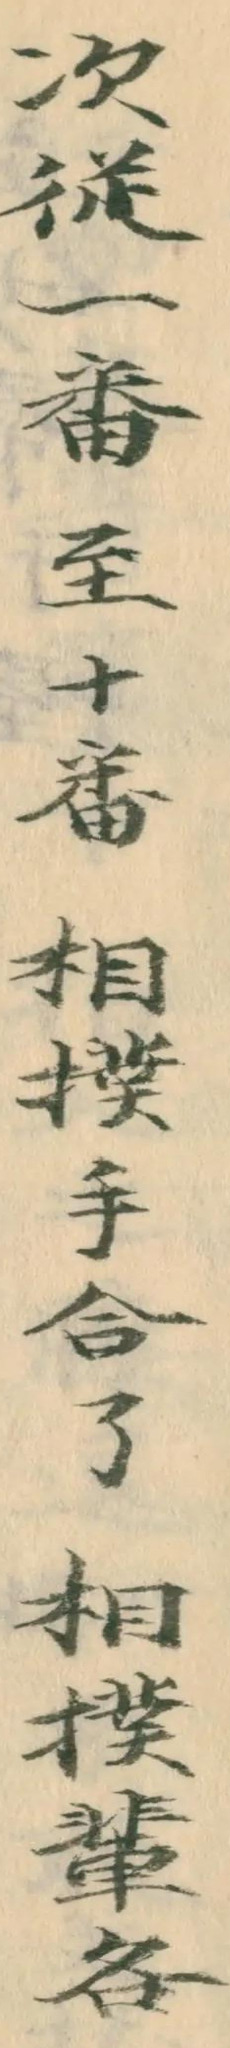次従一番至十番相撲手合了相撲輩各
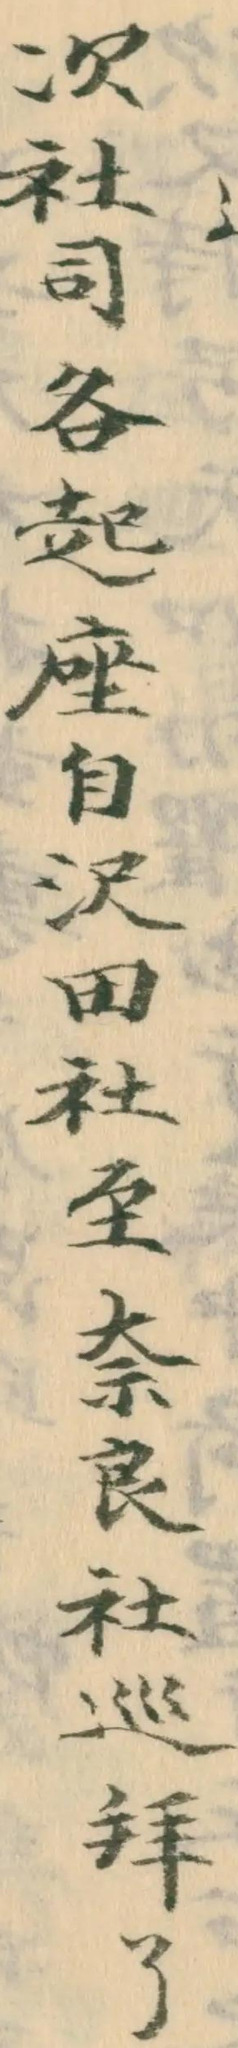次社司各起座自沢田社至奈良社巡拝了
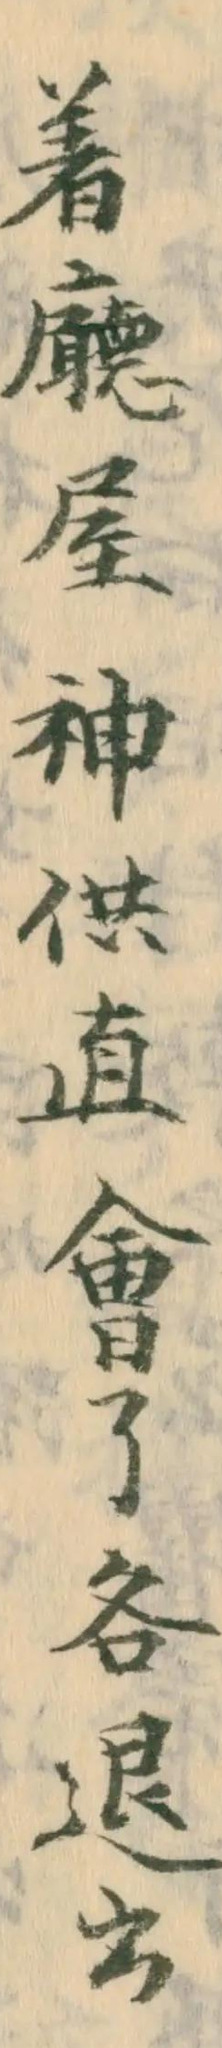着庁屋神供直会了各退出
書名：賀茂社記録. 第5冊
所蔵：国立国会図書館 National Diet Library, JAPAN
